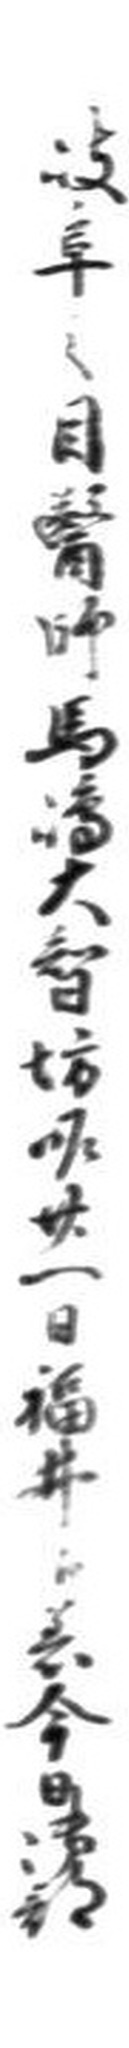岐阜之目医師馬嶋大智坊昨廿一日福井江着今日御部
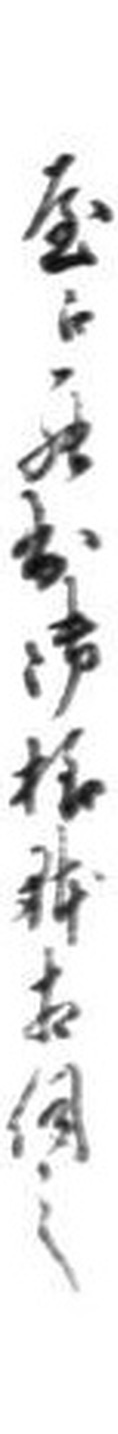屋江罷出御様体相伺之

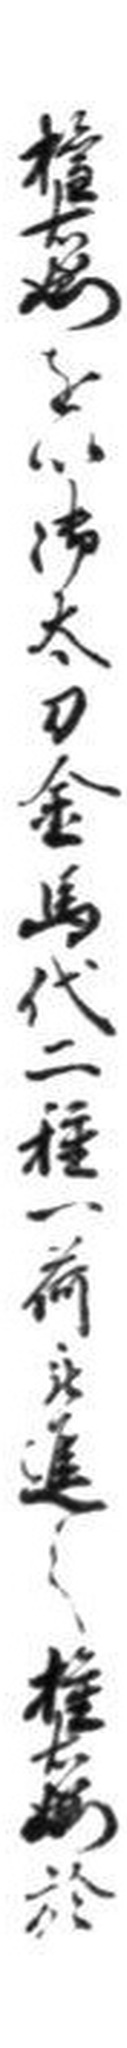権右衛門を以御太刀金馬代二種一荷被進之権右衛門於
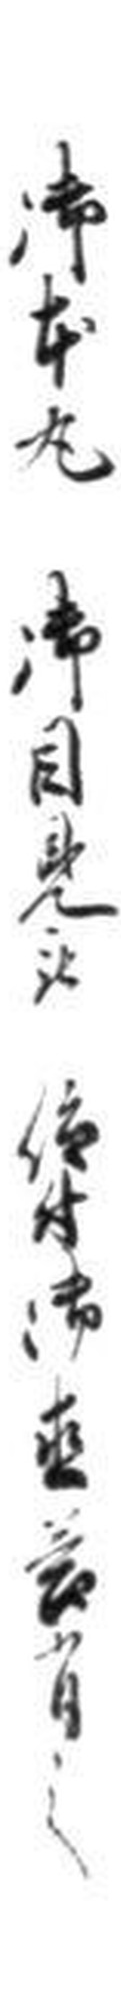御本丸御目見被仰付御直答有之
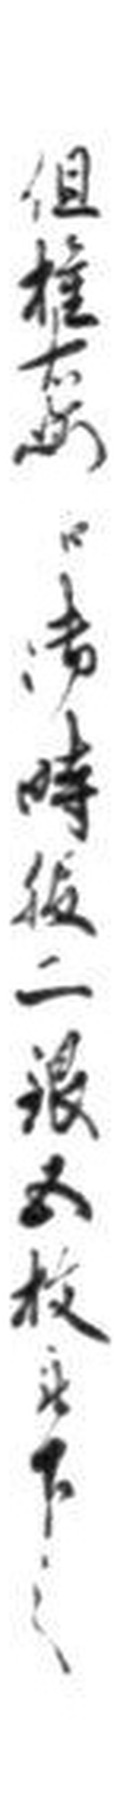但権右衛門江御時服二銀五枚被下之
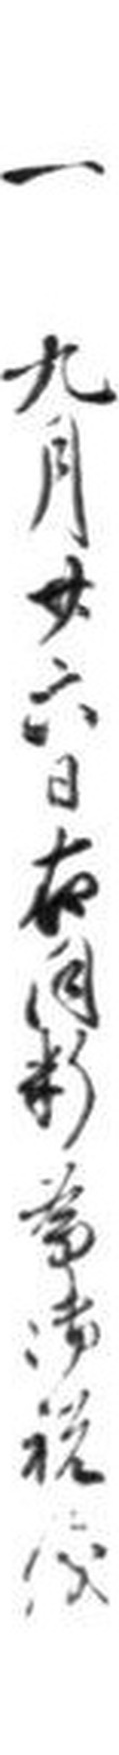一九月廿六日右同断為御祝儀
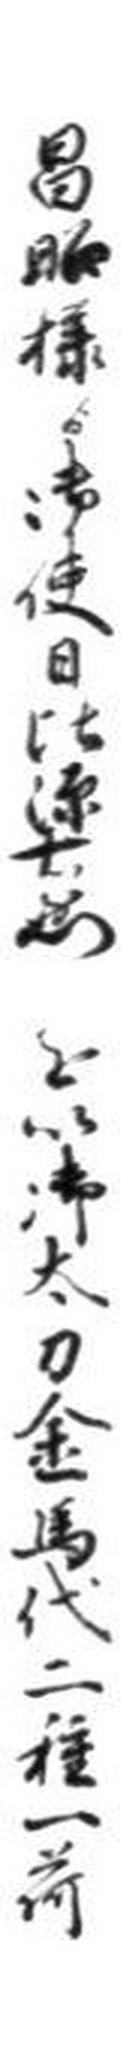昌昭様ゟ御使日比源右衛門を以御太刀金馬代二種一荷
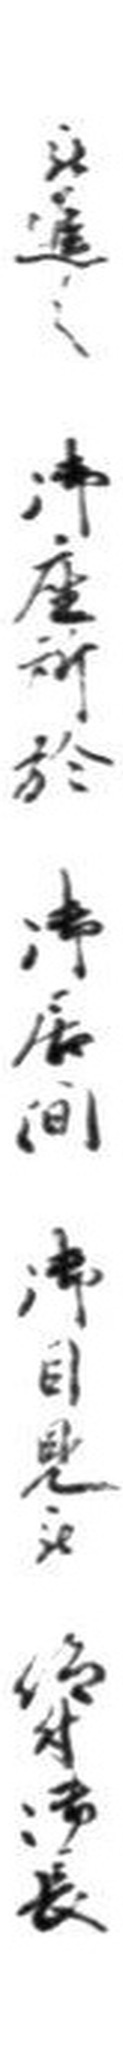被進之御座所於御居間御目見被仰付御長
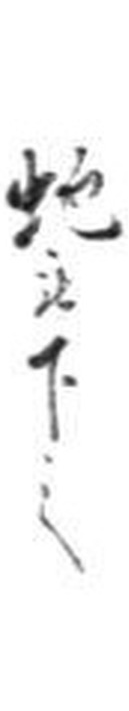蚫被下之
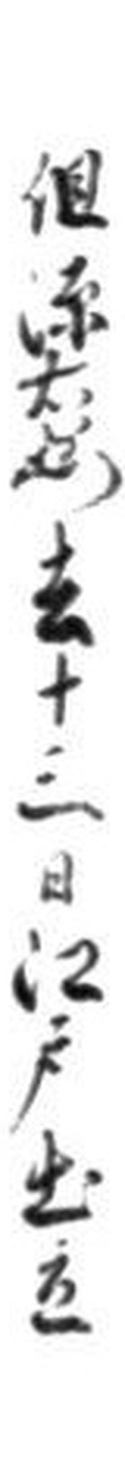但源右衛門去十三日江戸出立
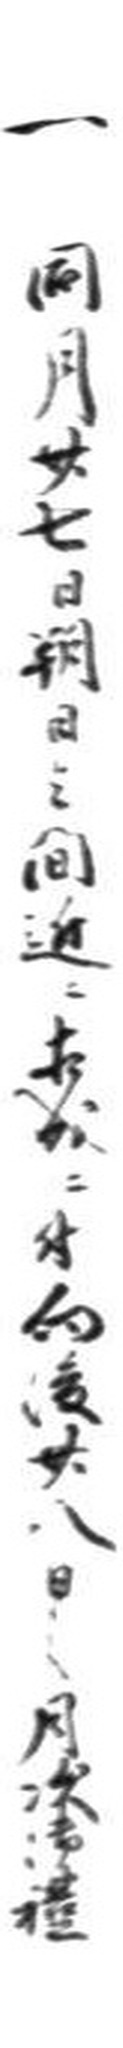一同月廿七日朔日与間近ニ相成ニ付向後廿八日之月次御礼
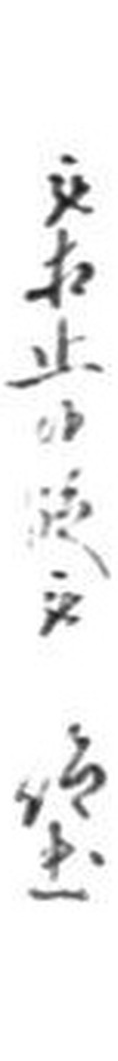被相止候段被仰出
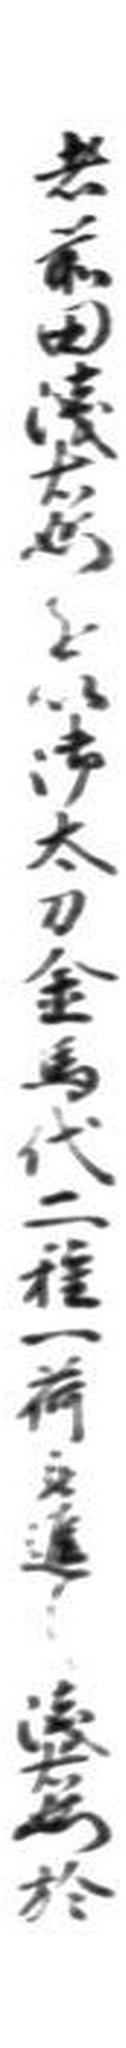者前田浅右衛門を以御太刀金馬代二種一荷被進之浅右衛門於
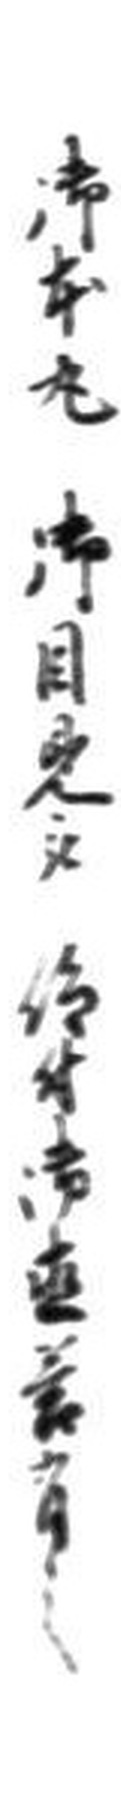御本丸御目見被仰付御直答有之
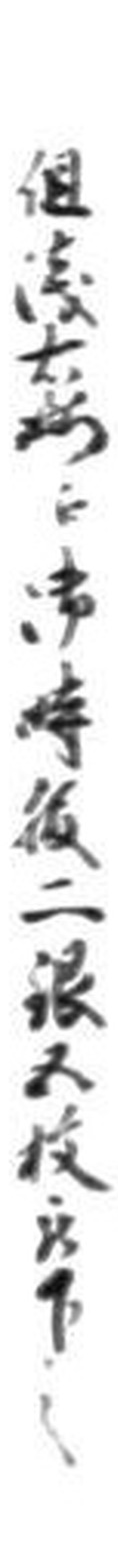但浅右衛門江御時服二銀五枚被下之
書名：家譜 三十五 宗昌公 従享保六年到同七年
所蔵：福井県文書館 Fukui Prefectural Archives
